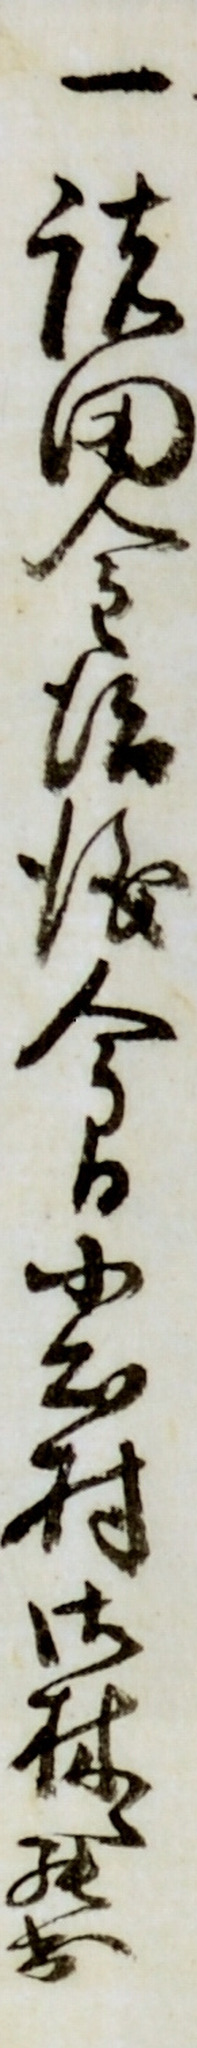一諸田金治儀今日小出村御林へ罷出
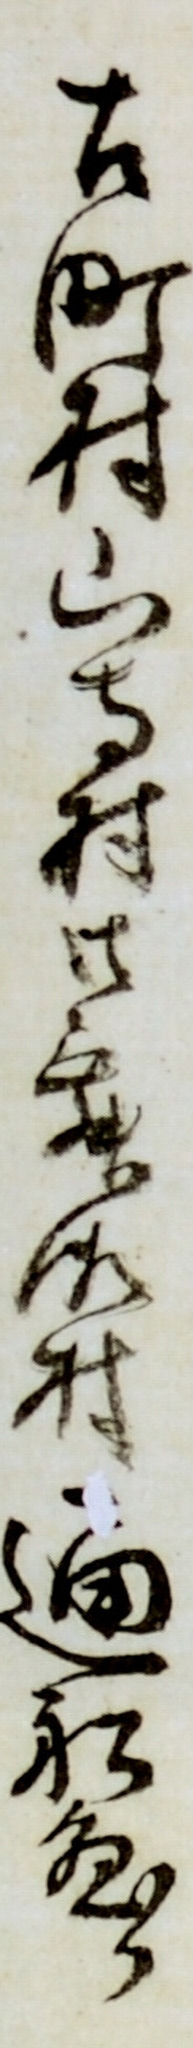古町村山寺村御乗り御村通船懸り

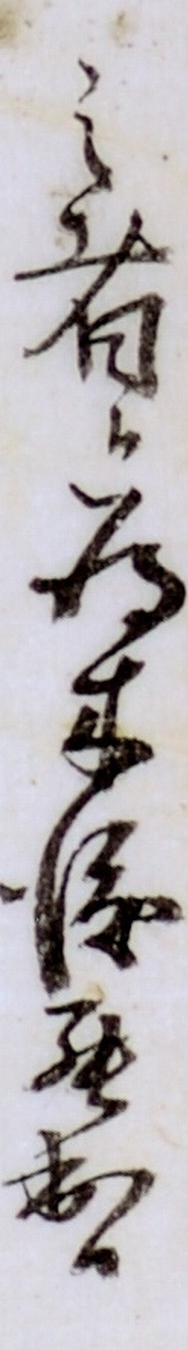之者え為木渡罷出候
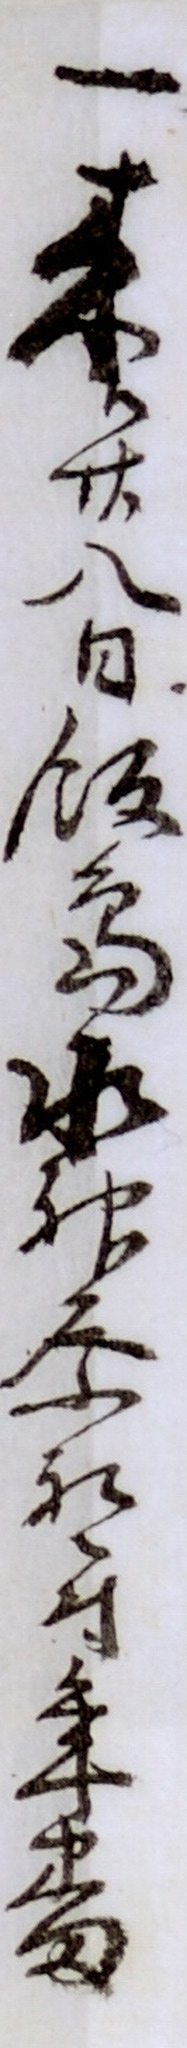一来ル廿八日飯島水神祭礼に付年番
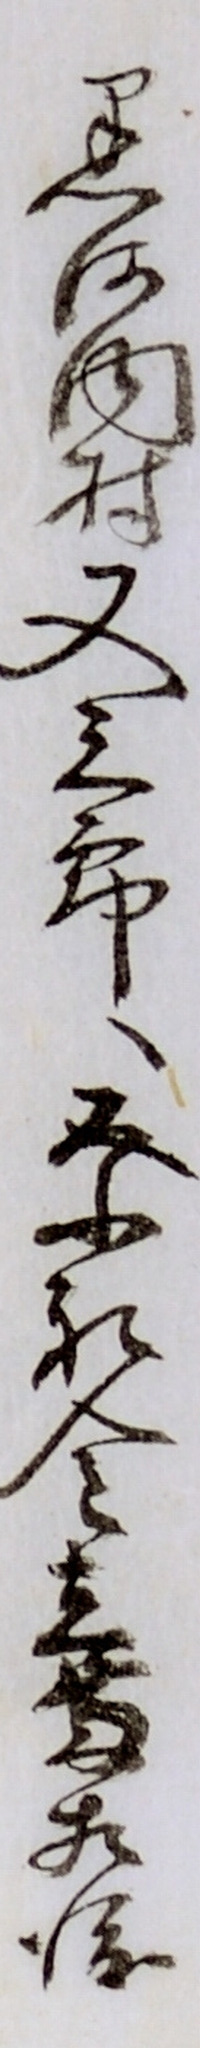黒河内村又三郎へ祭礼金壱両相渡
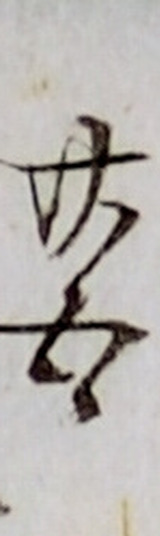廿二日
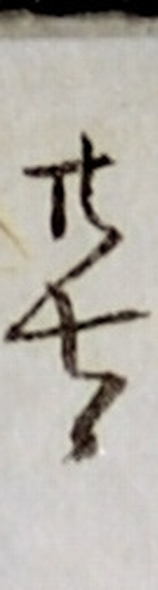廿七日
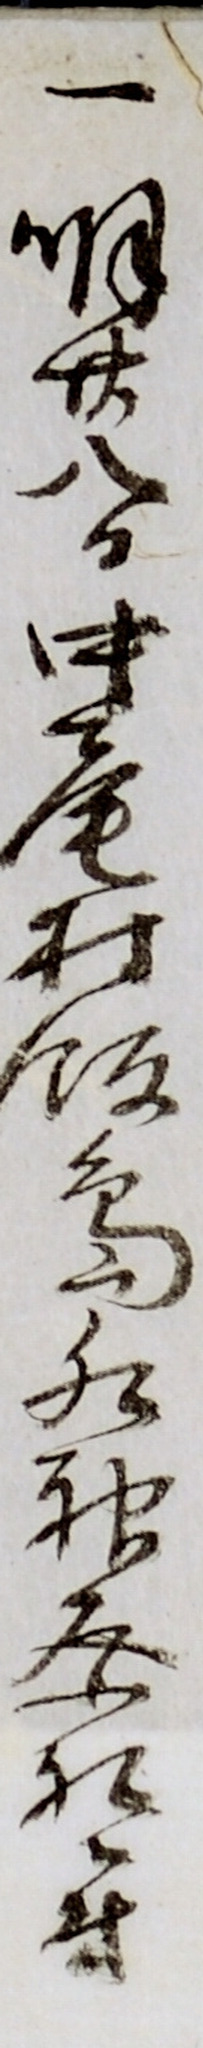一明廿八日中尾村飯島水神祭礼に付
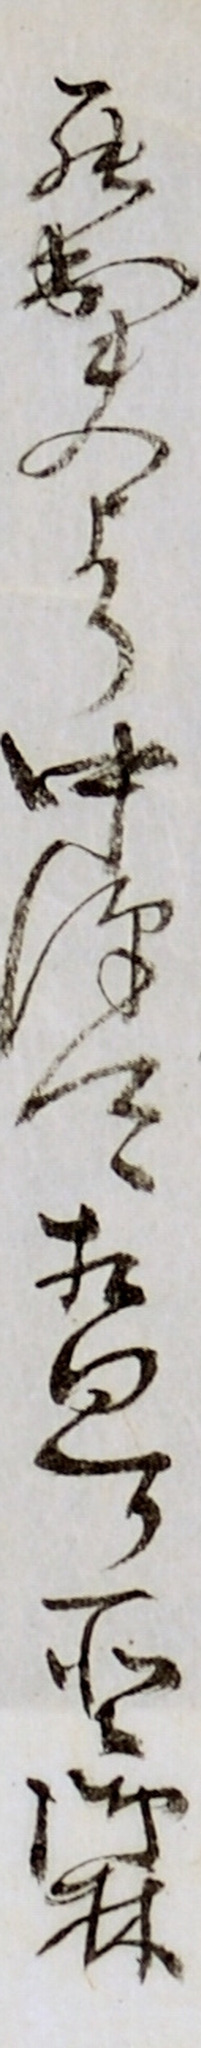罷出夫より中津郷へ相廻り所々御林
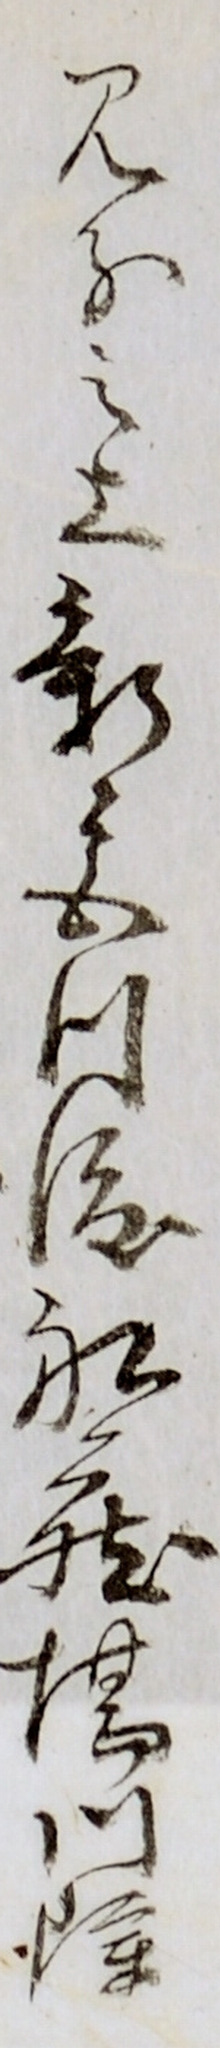見分之上新宮川渡船蔵場川除
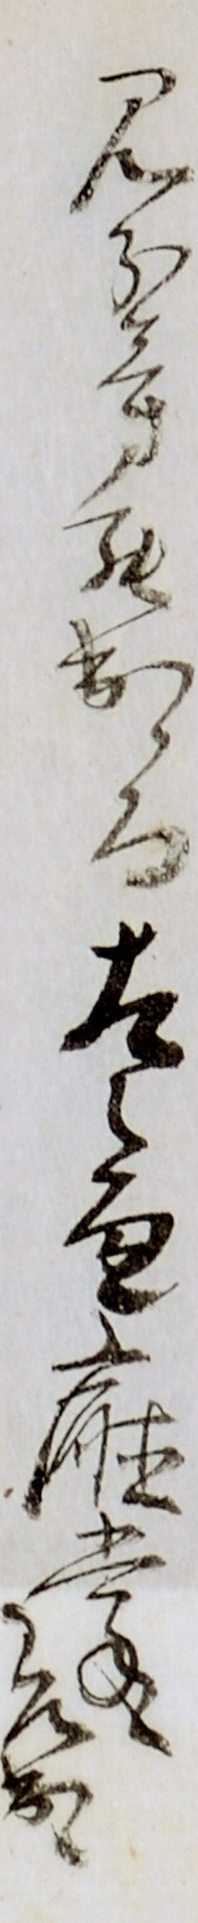見分旁罷出候間左之通庁掌へ差出候
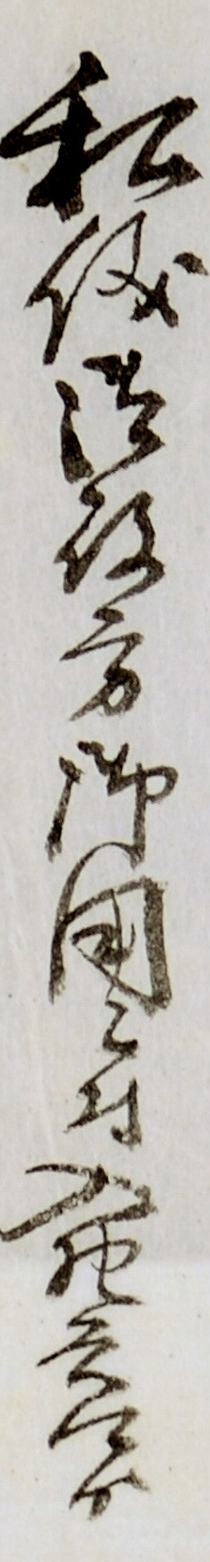私儀御役方御用に付入野谷郷ゟ
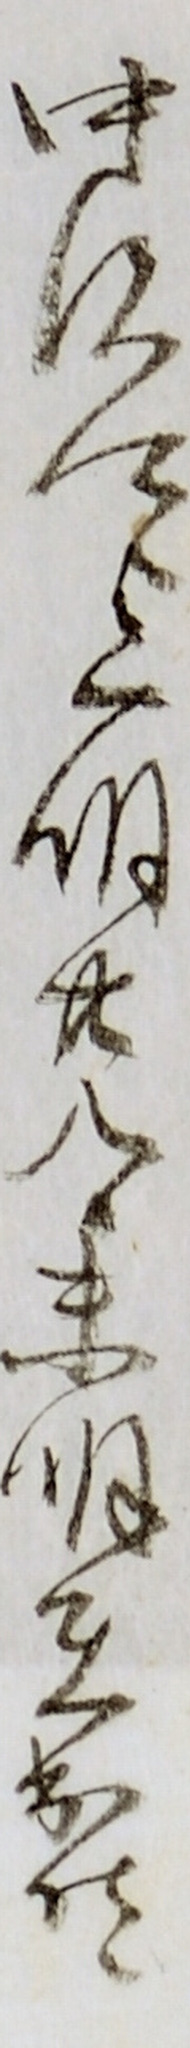中沢郷迄明廿八日未明在出仕
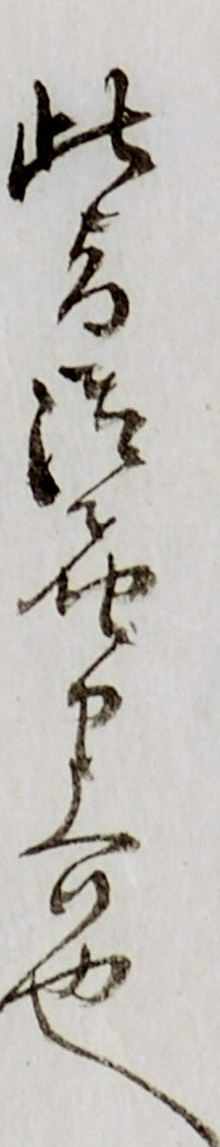此旨御届申上候也
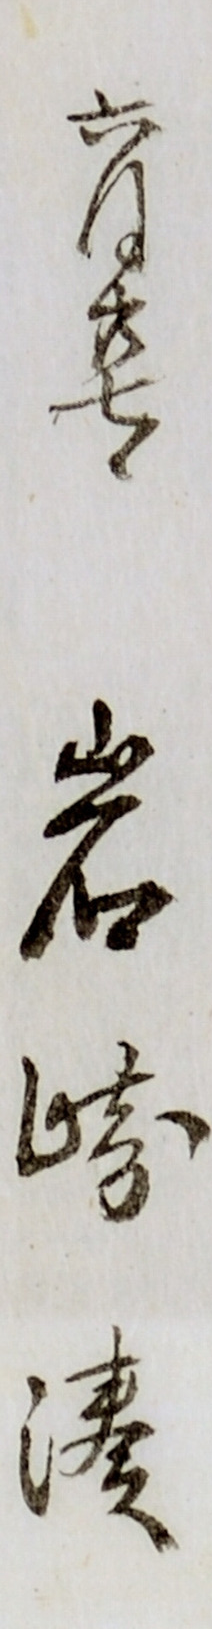六月廿七日岩崎湊
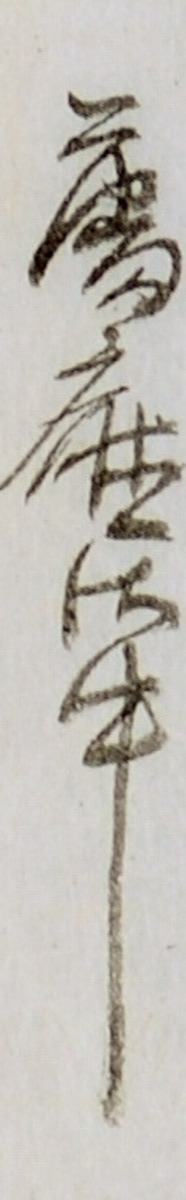藩庁御中
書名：山林方諸事御用留
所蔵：伊那市立高遠町図書館・合同会社AMANE
